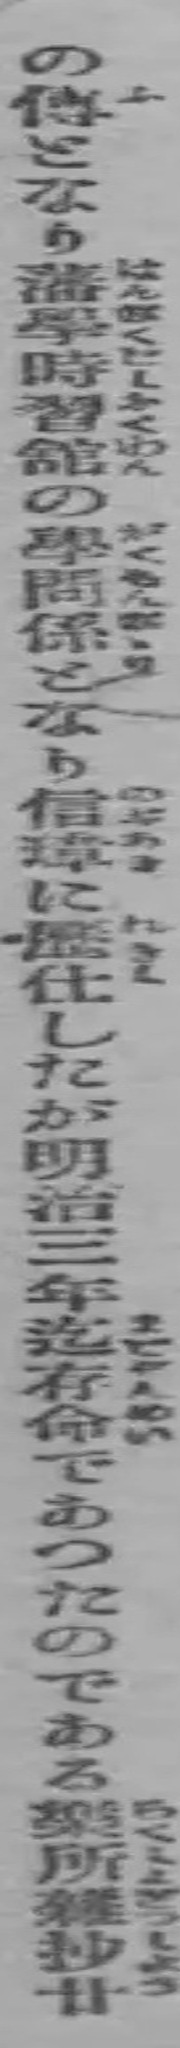の傅となり藩学時習館の学問係となり信璋に歴仕したが明治三年迄存命であつたのである楽所雑抄廿

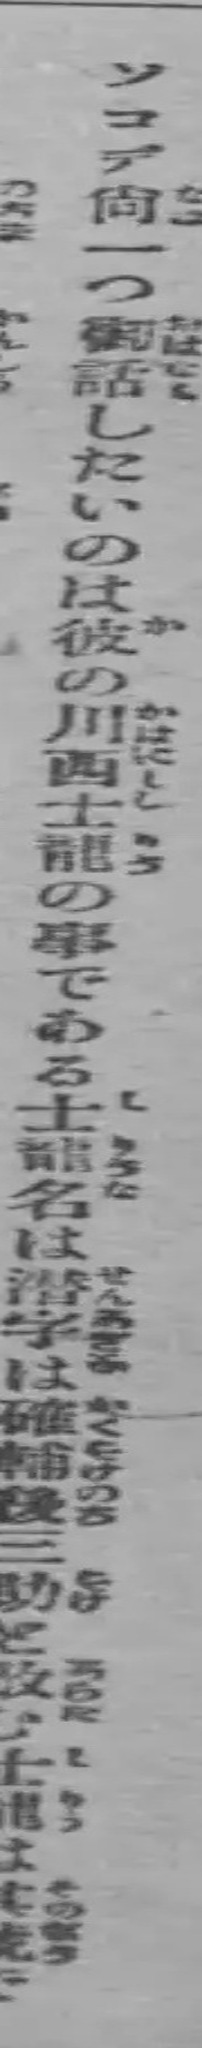川西士龍ソコデ尚一つ御話したいのは彼の川西士龍の事である士龍名は潜字は確輔後三助と改む士龍は其号で
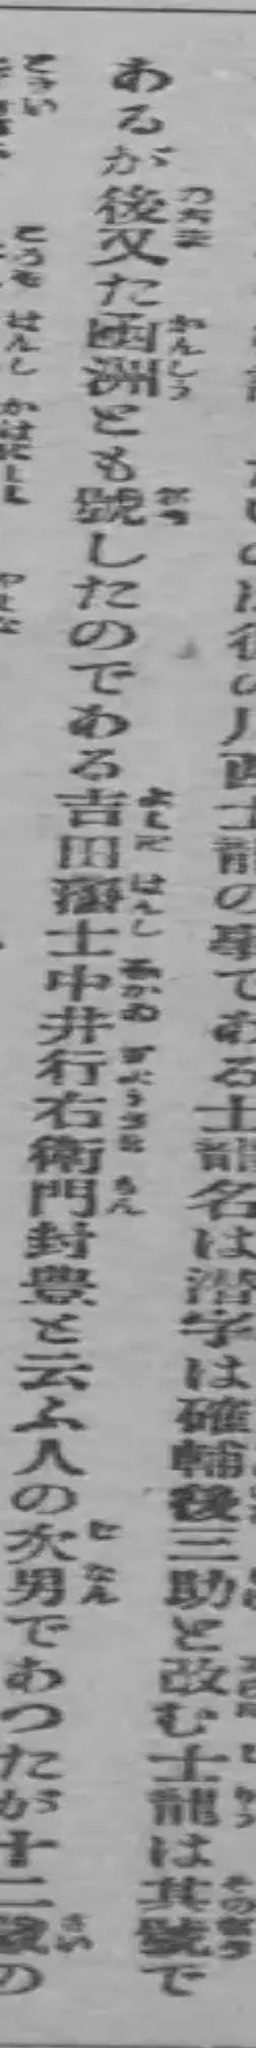あるが後又た函洲とも号したのである吉田藩士中井行右衛門封豊と云ふ人の次男であつたが十二歳の
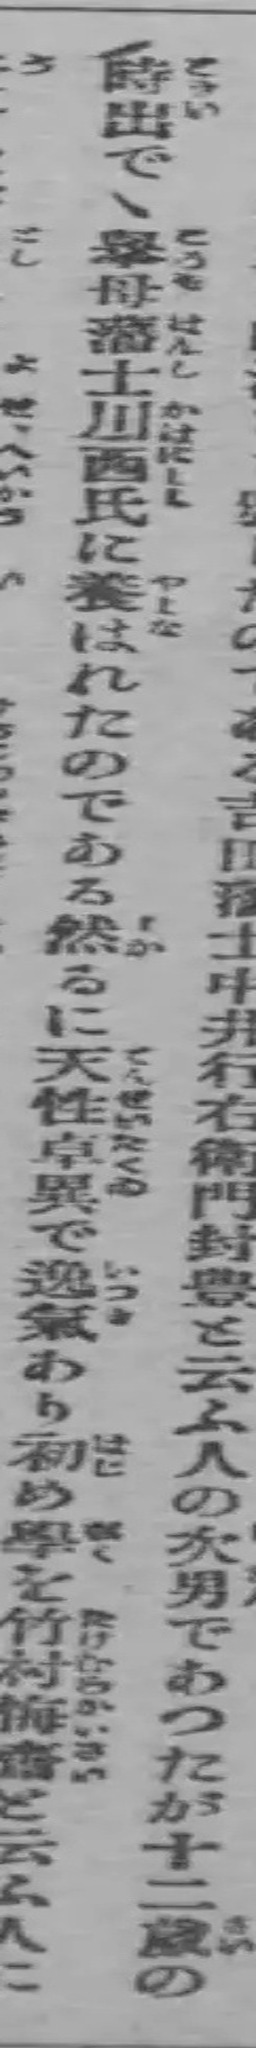時出でゝ拳母藩士川西氏に養はれたのである然るに天性卓異で逸気あり初め学を竹村悔斉と云ふ人に
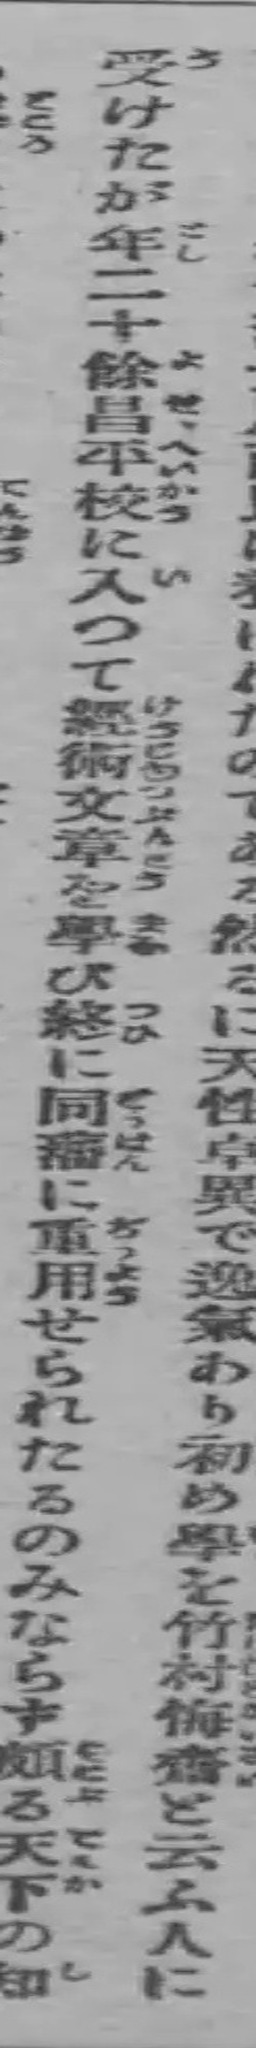受けたが年二十余昌平校に入つて経術文章を学び終に同藩に重用せられたるのみならず頗る天下の知
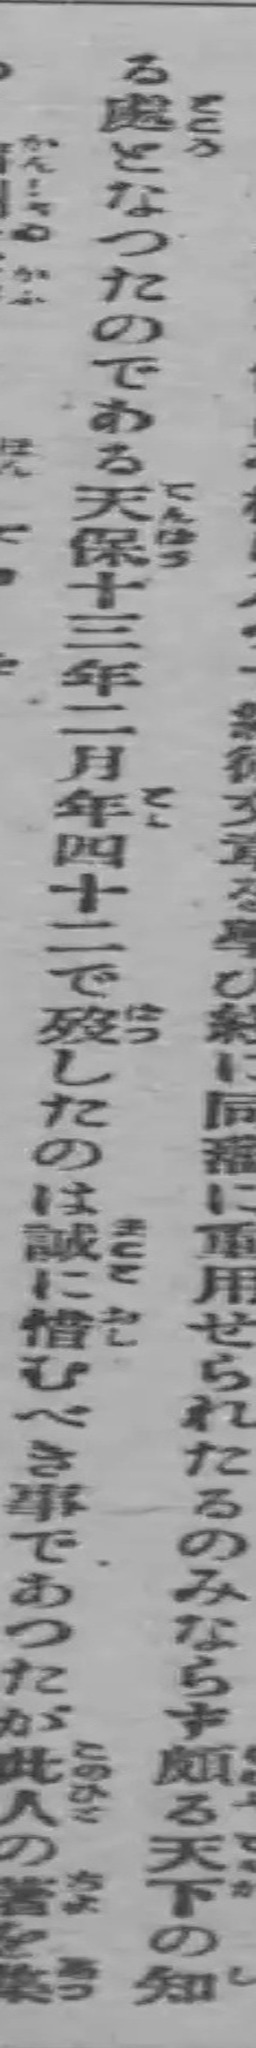る処となつたのである天保十三年二月年四十二で歿したのは誠に惜むべき事であつたが此人の著を集
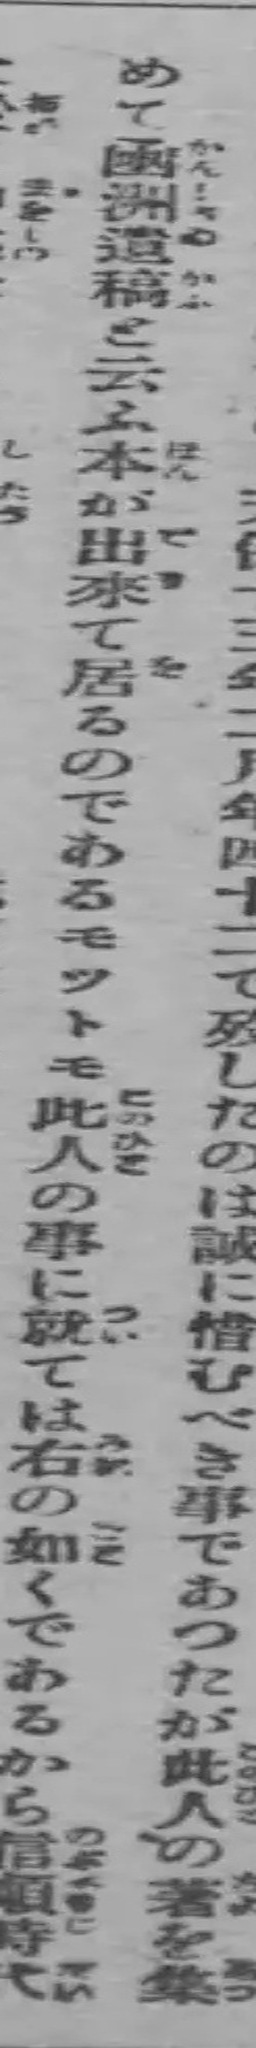めて函洲遺稿と云ふ本が出来て居るのであるモツトモ此人の事については右の如くであるから信順時代
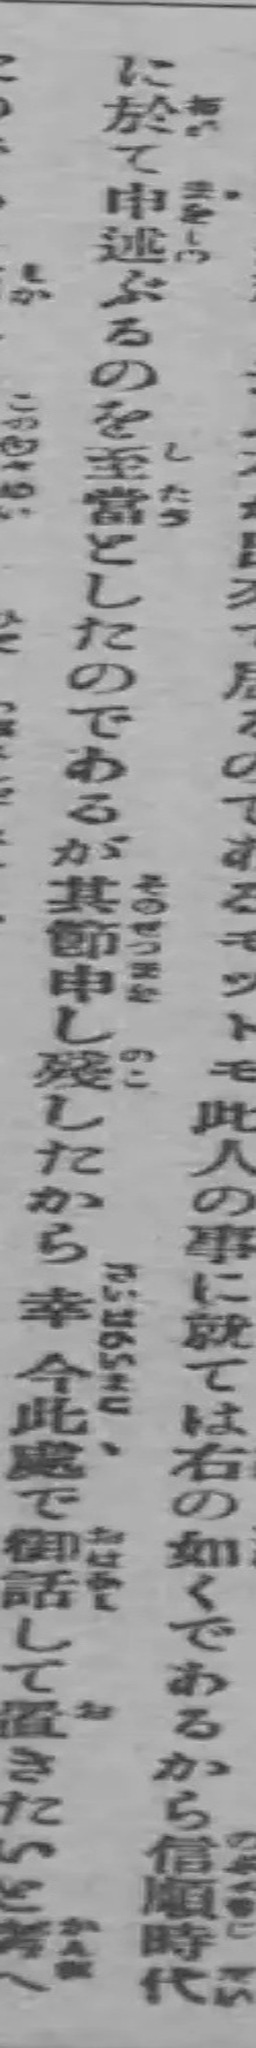に於て申述ぶるのを仕当としたのであるが其節申し残したから幸今此処で御話して置きたいと考へ
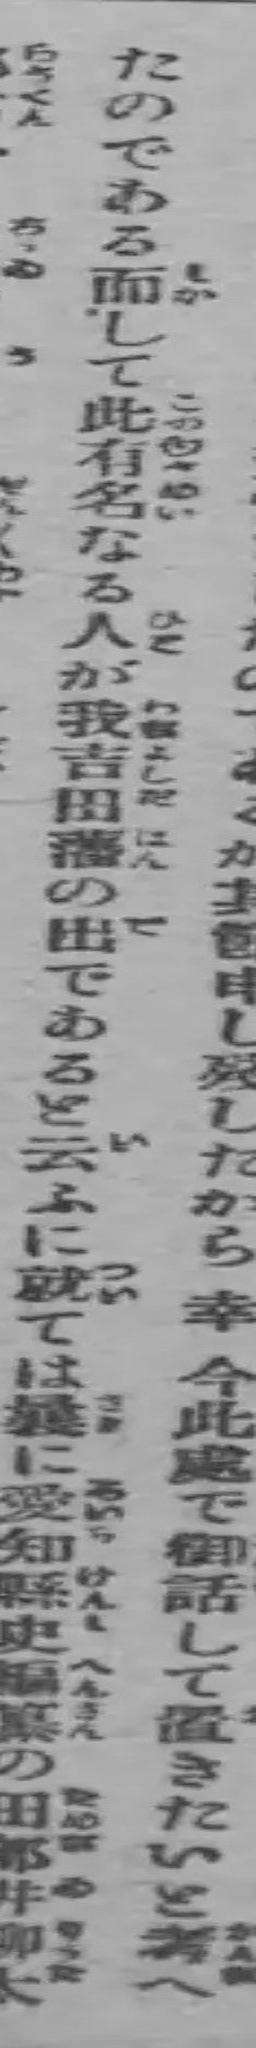たのである而して此有名なる人が我吉田藩の出であると云ふに就ては曩に愛知県史編纂の田部井鉚太
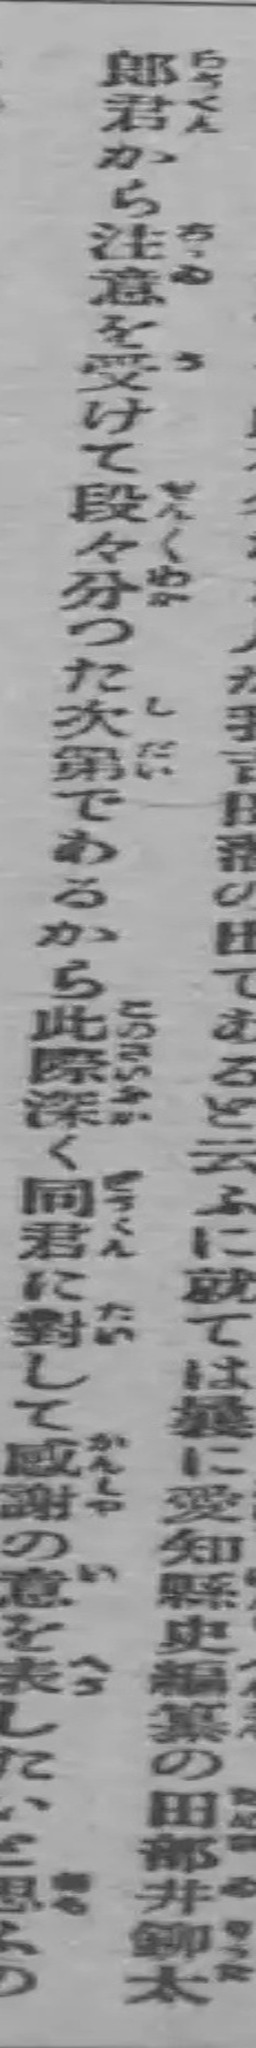郎君から注意を受けて段々分つた次第であるから此際深く同君に対して感謝の意を表したいと思ふの
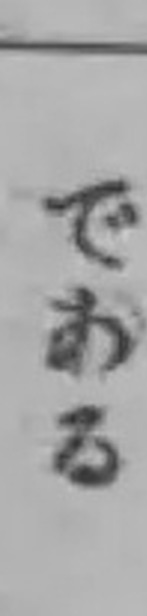である
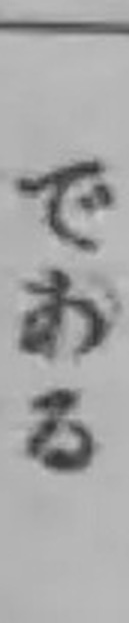である
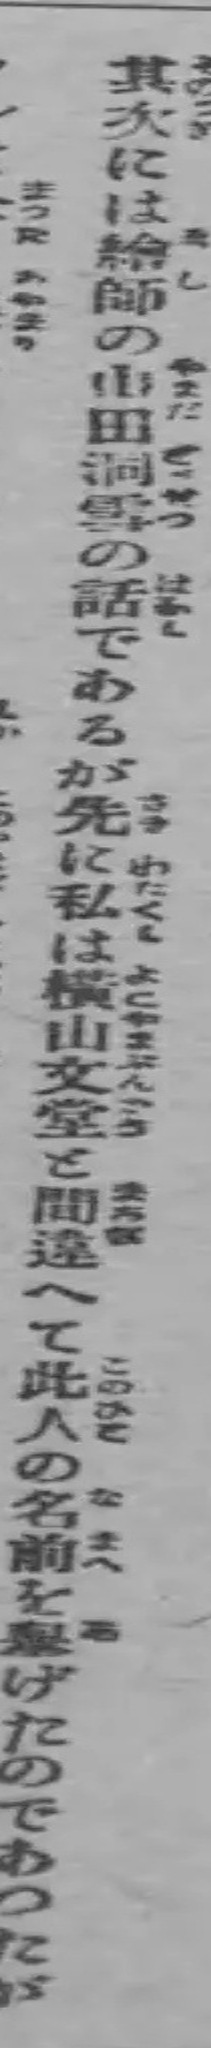山田洞雪其次には絵師の山田洞雪の話であるが先に私は横山文堂と間違へて此人の名前を挙げたのであつたが
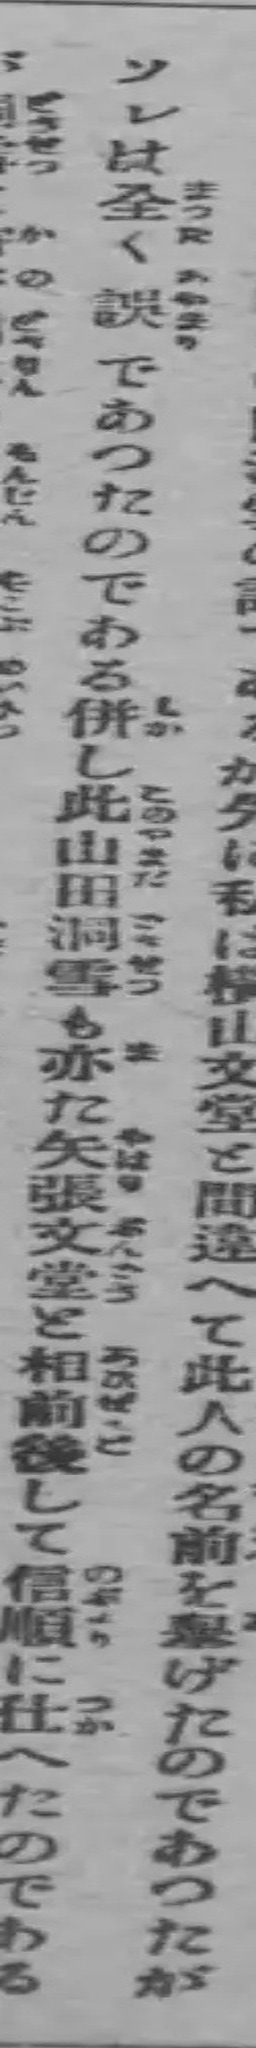ソレは全く誤であつたのである併し此山田洞雪も亦た矢張文堂と相前後して信順に仕へたのである
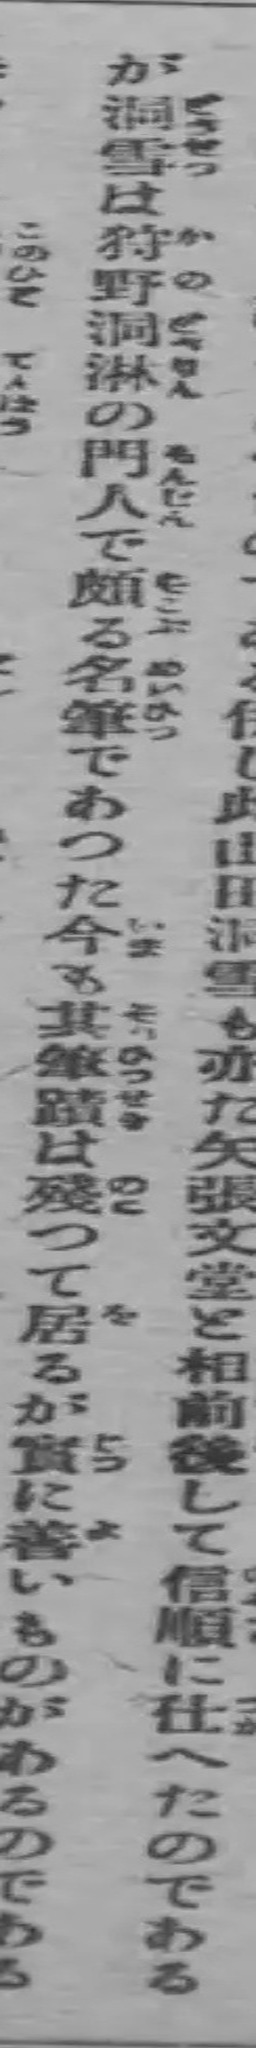が洞雪は狩野洞淋の門人で頗る名筆であつた今も其筆蹟は残つて居るが実に善いものがあるのである
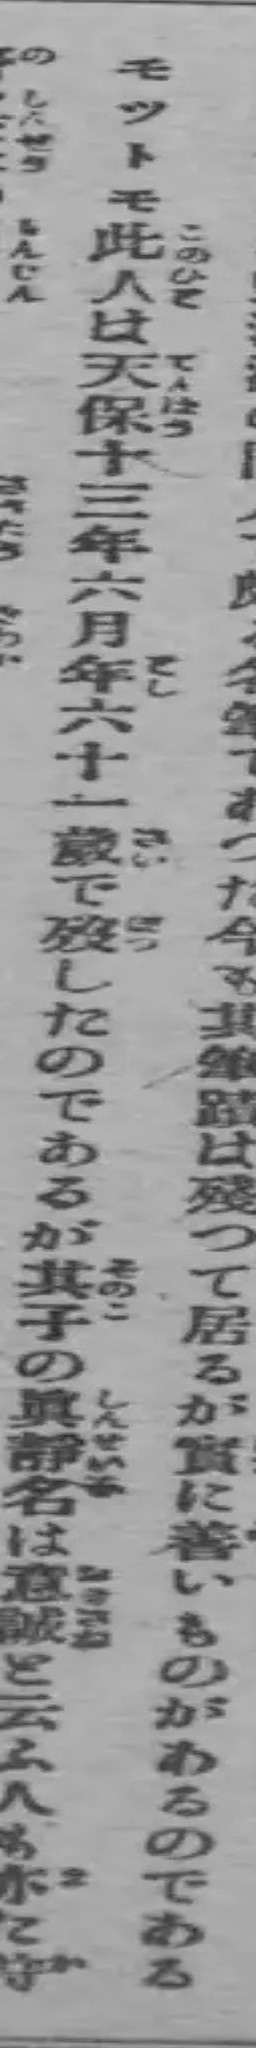モツトモ此人は天保十三年六月年六十一歳で歿したのであるが其子の眞静名は意誠と云ふ人も亦た狩
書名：豊橋市史談
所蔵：国立国会図書館 National Diet Library, JAPAN
